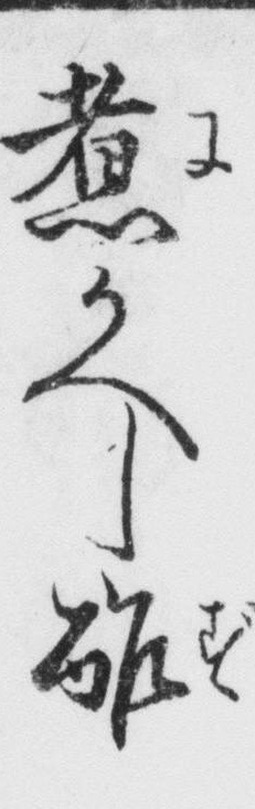煮かへし酢

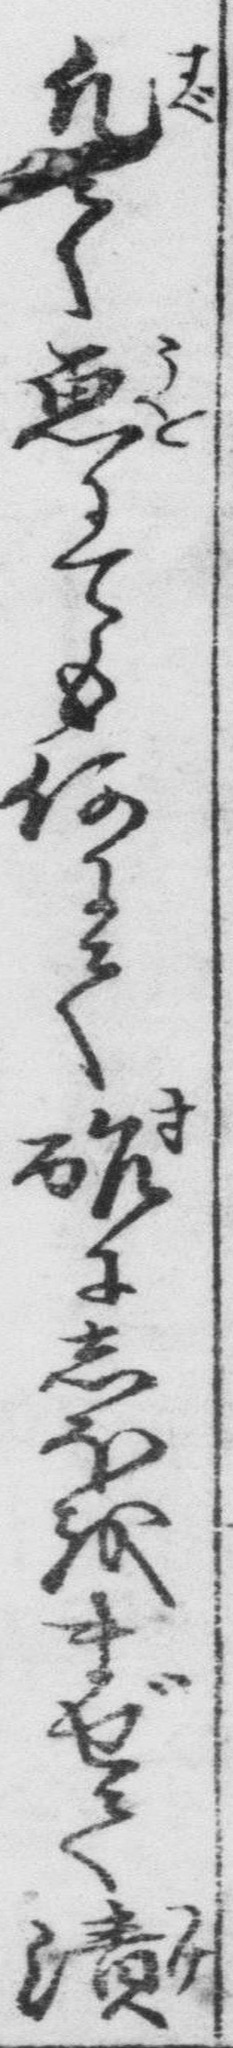凡て魚にても何にて酢にしほをまぜて漬
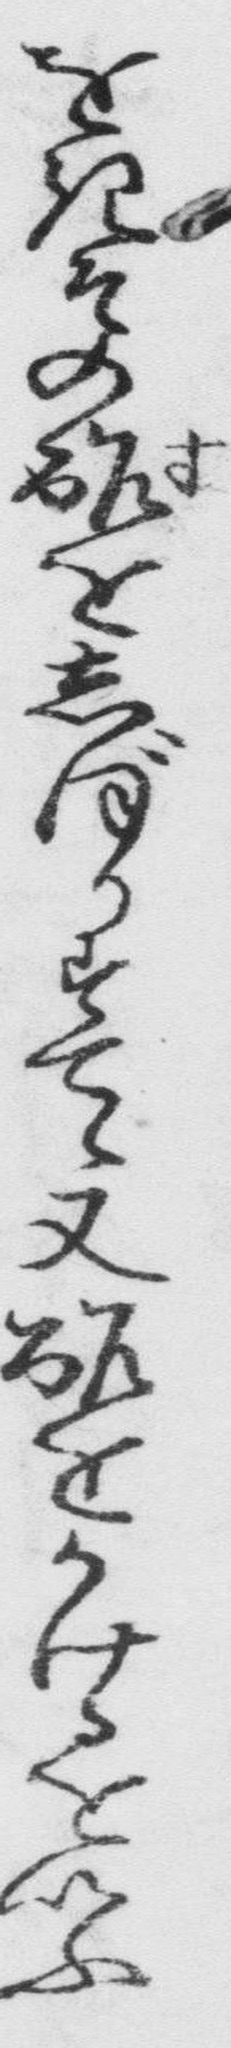をきその酢をしぼりて又酢をかけるをいふ
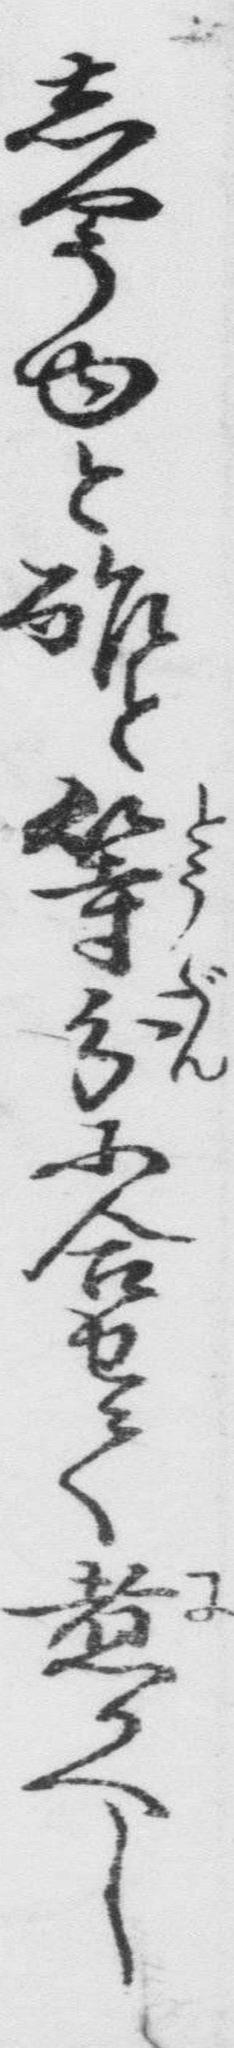しやうゆと酢と等分に合せて煮かへし
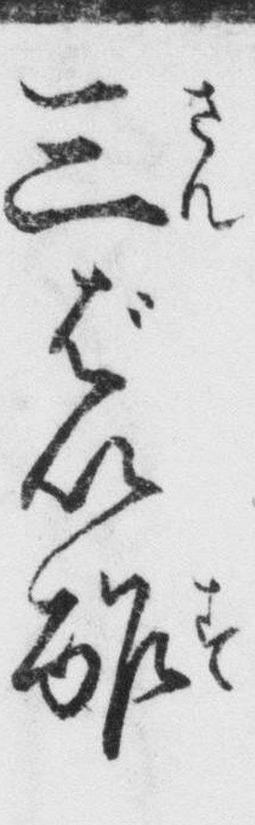三ばい酢
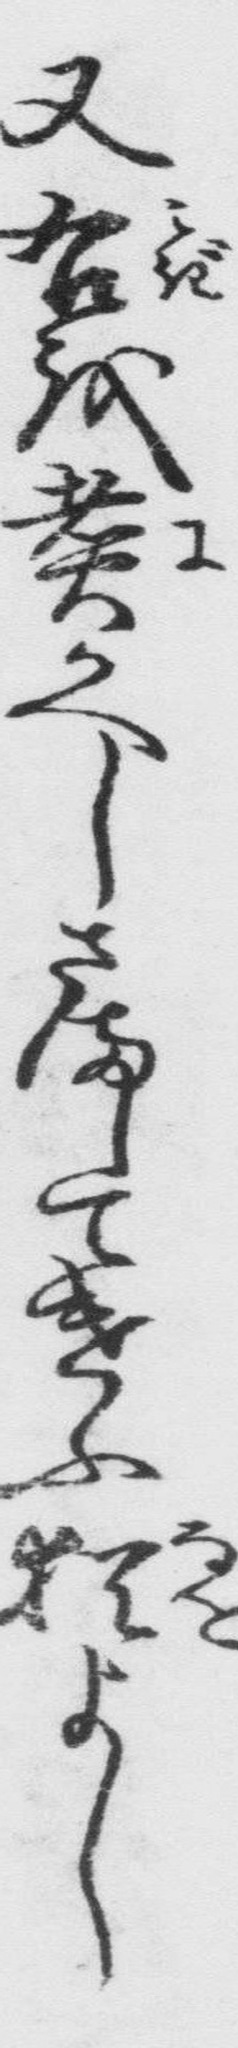又右を煮かへしてさまして遣ふ猶よし
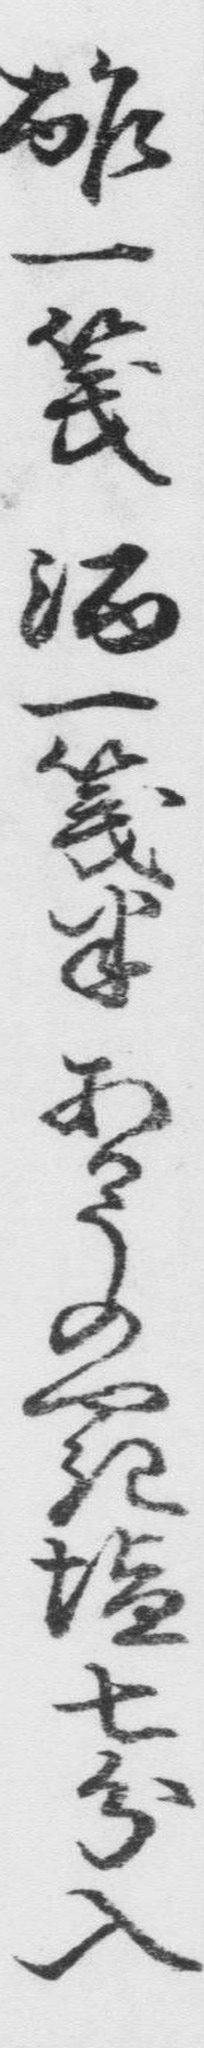酢一酒一半あかうのやき塩七分入
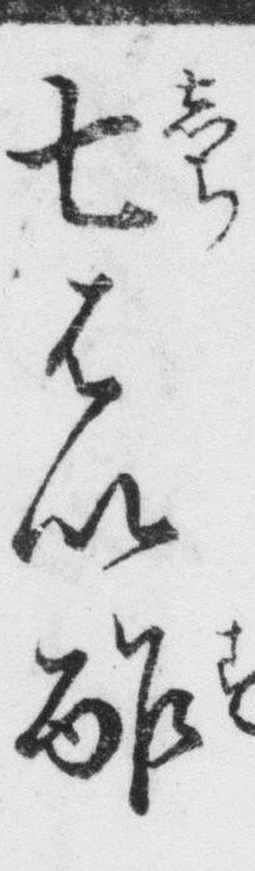七はい酢
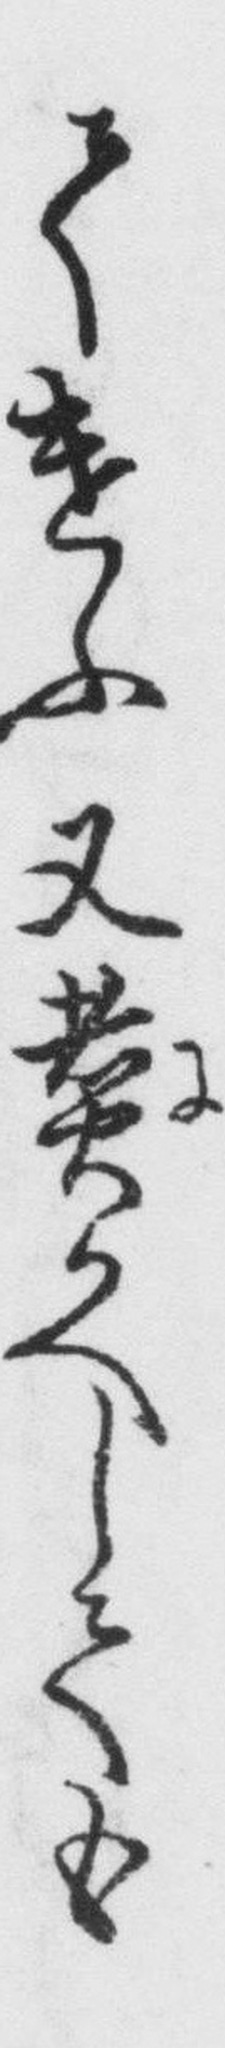て遣ふ又煮かへしても
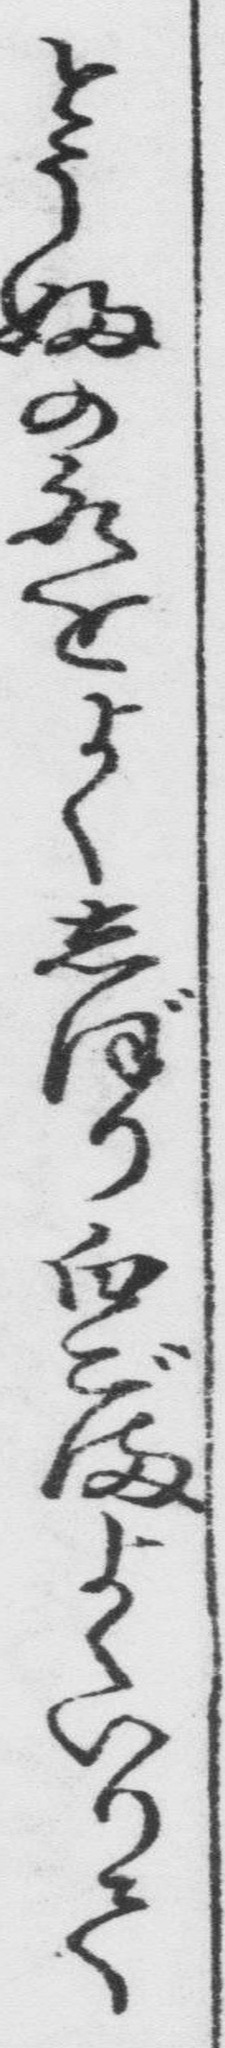とうふの水をよくしぼり白ごまよくいりて
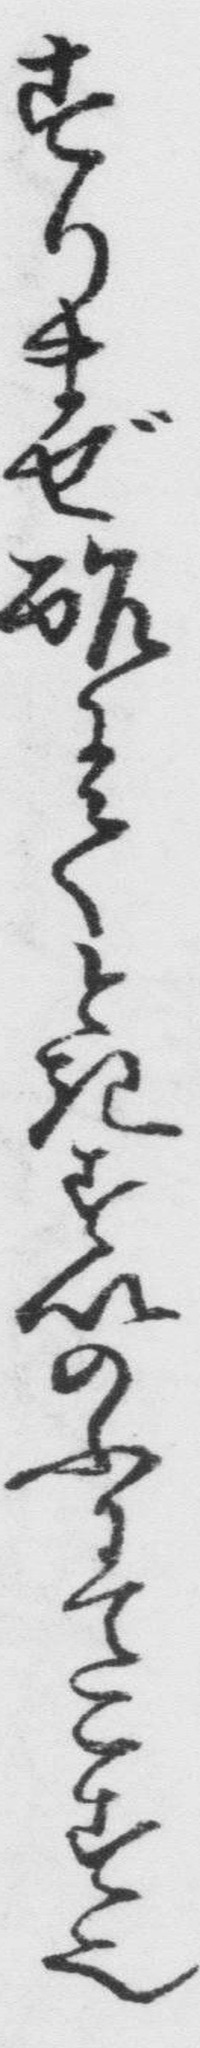すりまぜ酢にてときすいのふにてこす也
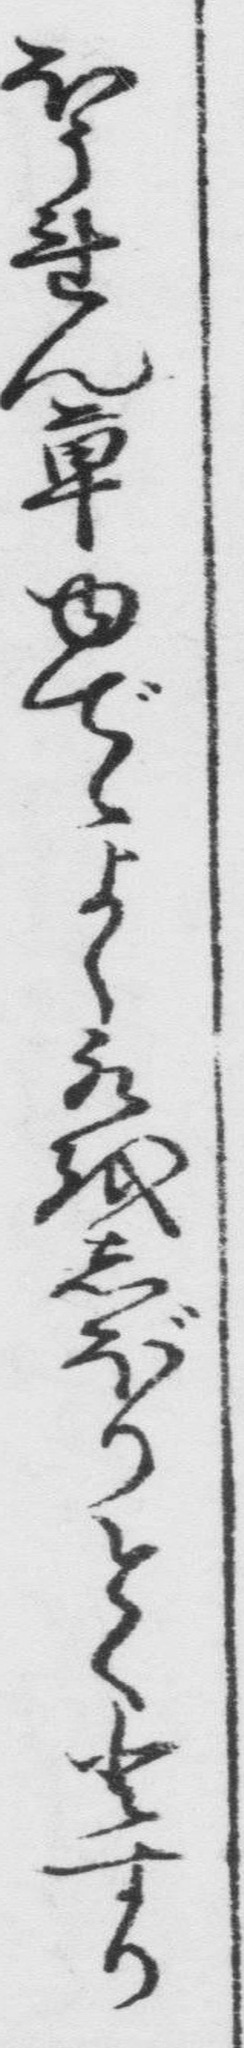ほうれん草ゆでてよく水気をしぼりとくとすり
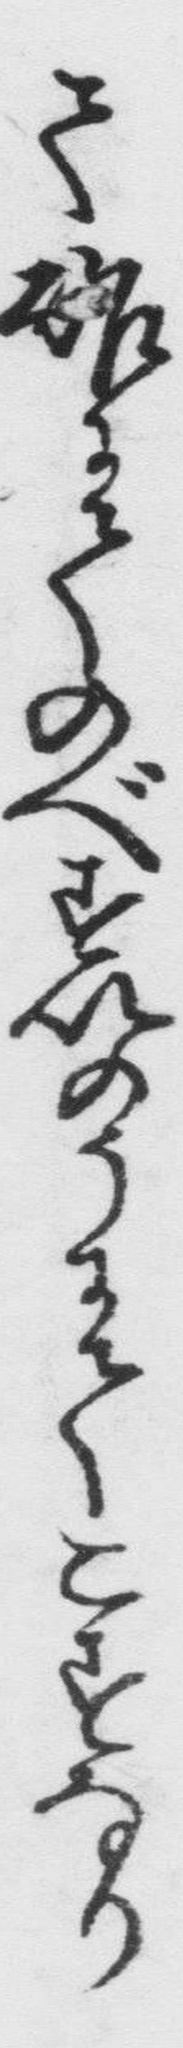て酢にてのべすいのふにてこすなり
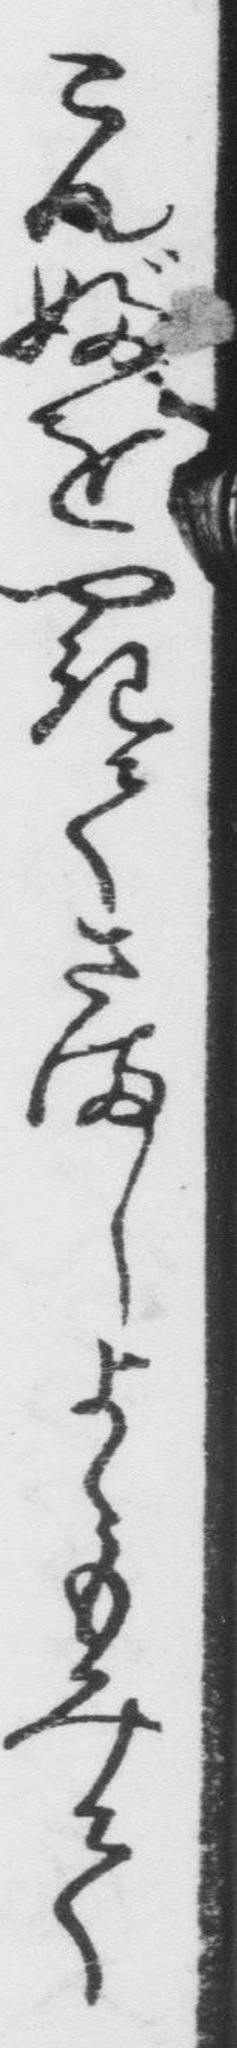こんぶをやきてさましよくもみて
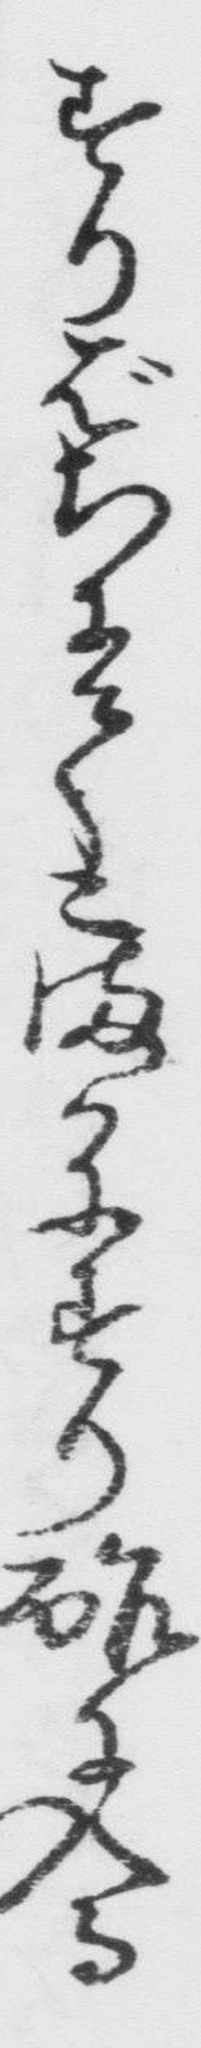すりばちにてこまかにすり酢に入る
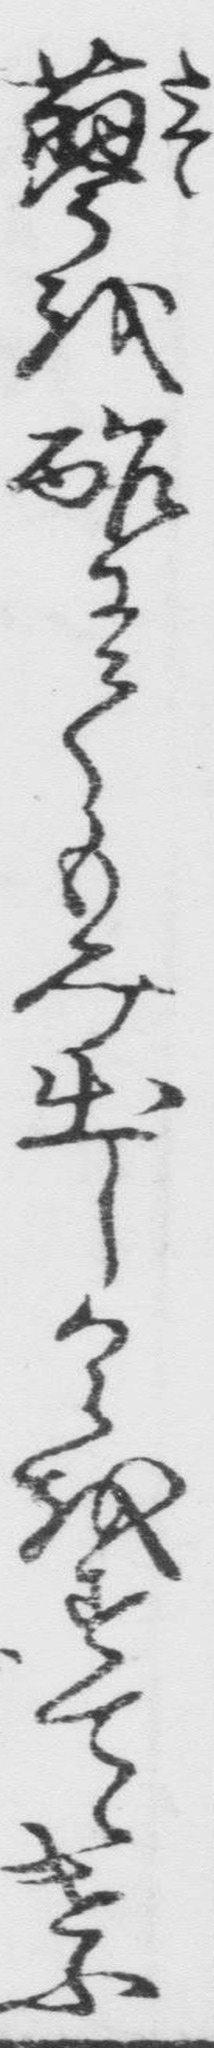蓼を酢にてもみだしからをすてゝ遣ふ
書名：料理早指南
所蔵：大阪府立大学学術情報センター 国文学研究資料館
